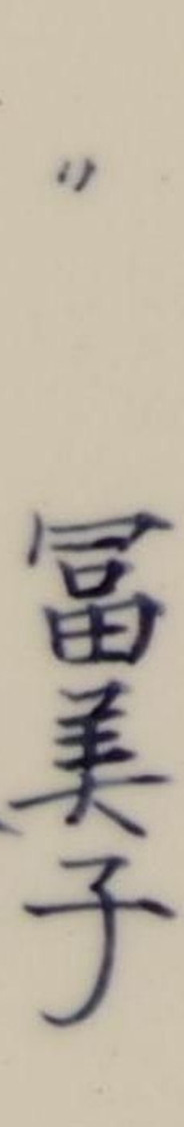冨美子
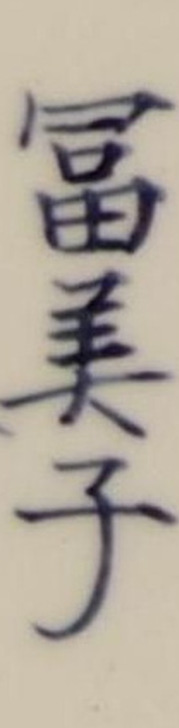冨美子

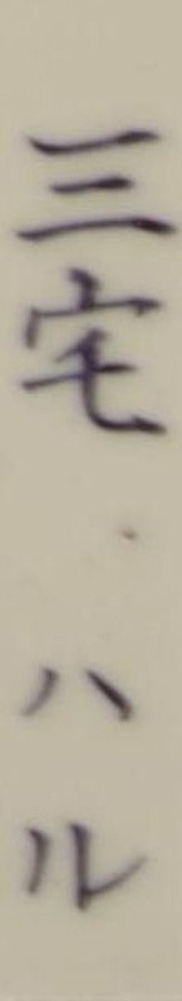三宅ハル
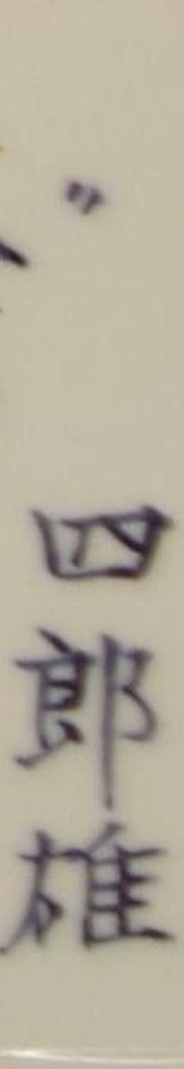四郎雄
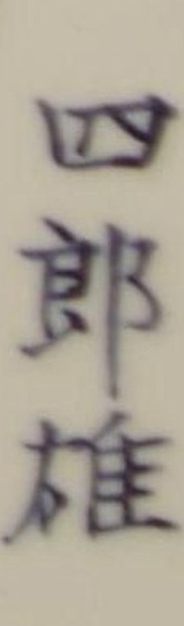四郎雄
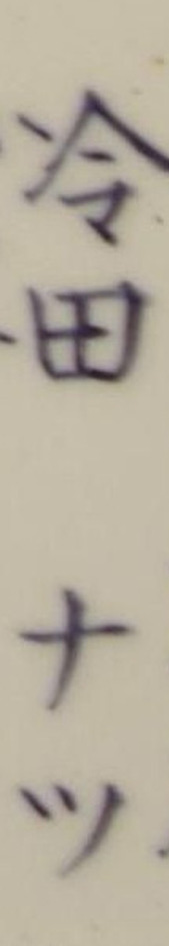冷田ナツ
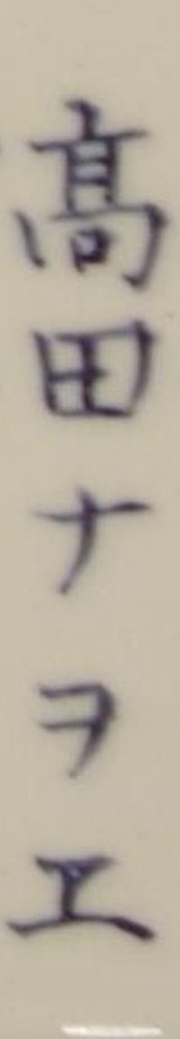高田ナヲエ
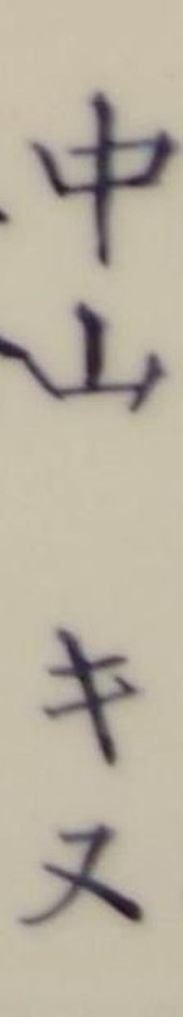中山キヌ
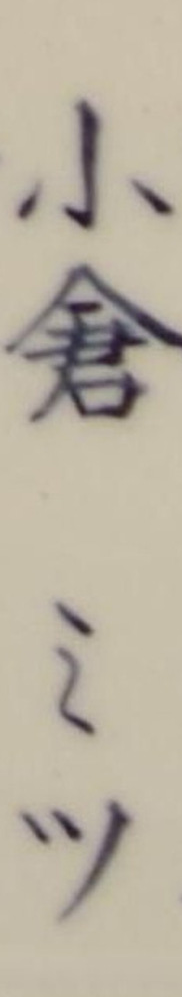小倉ミツ
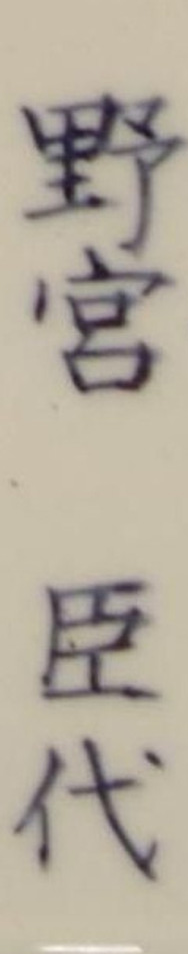野宮臣代
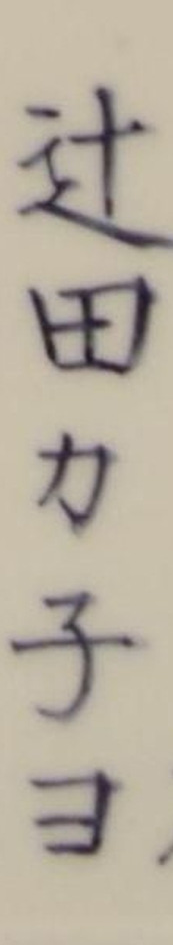辻田カネヨ
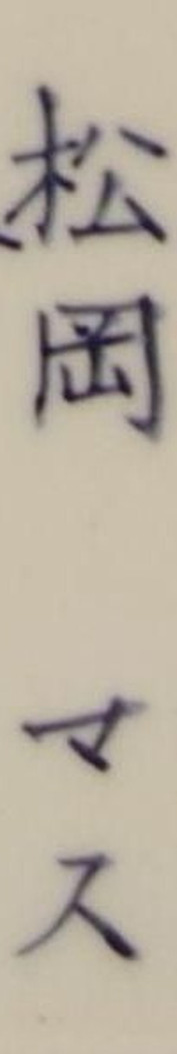松岡マス
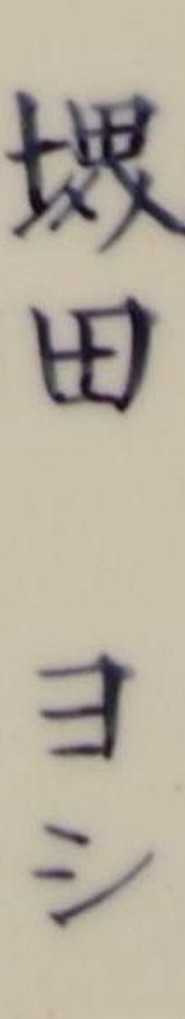堺田ヨシ
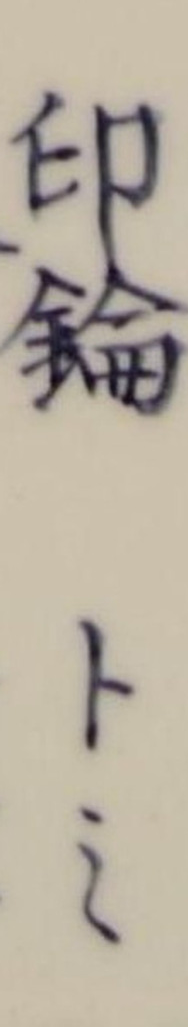印鑰トミ
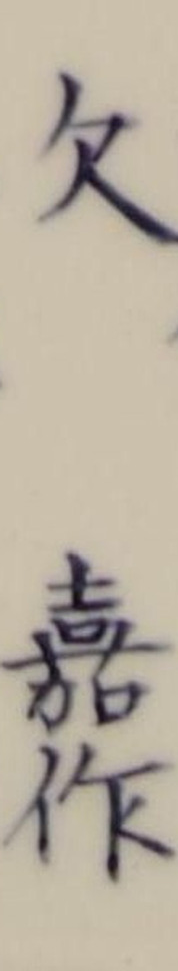欠嘉作
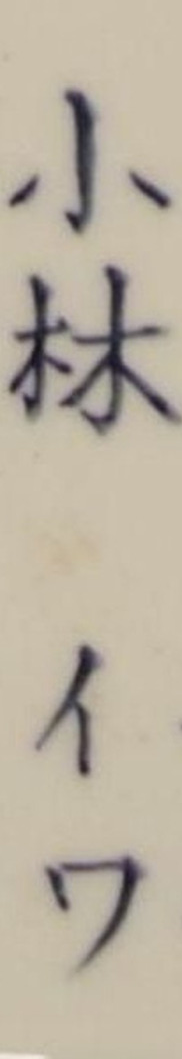小林イワ
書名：E~L
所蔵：高野山金剛峯寺
